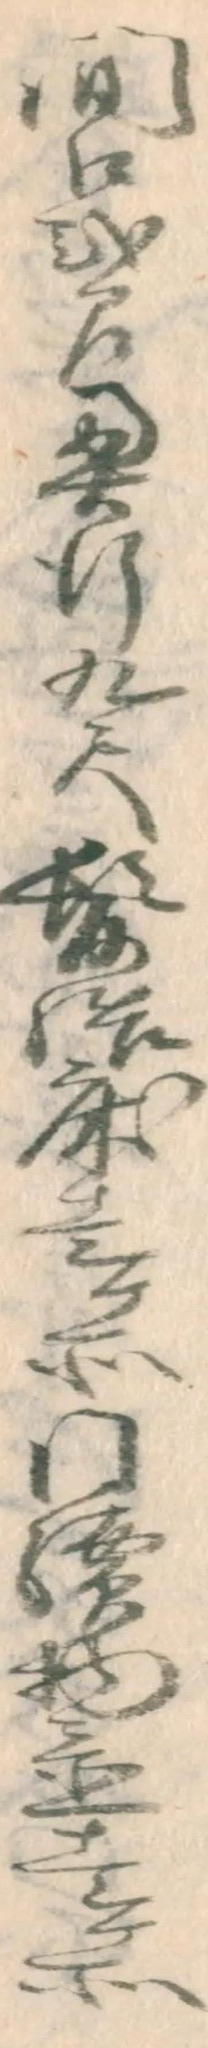間口弐間奥行九尺髪結床壱ヶ所同続物置壱ヶ所

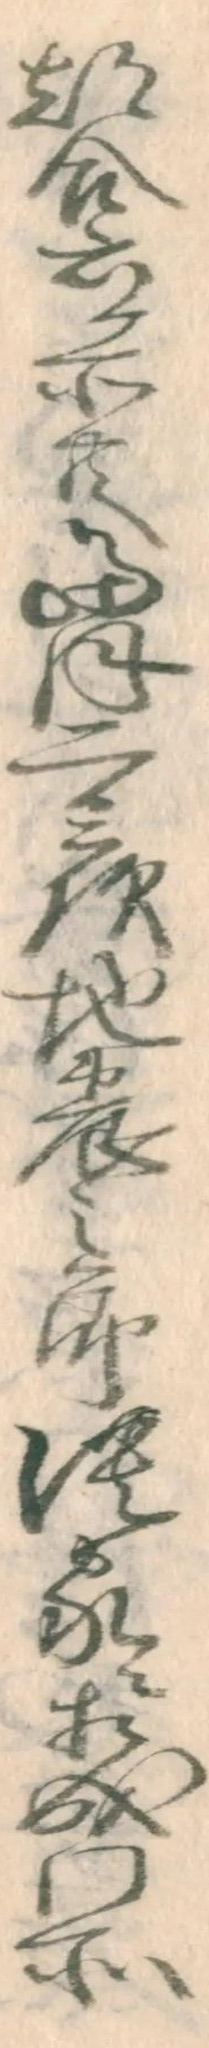都合六ヶ所共当月二日夜地震之節潰家ニ相成同所
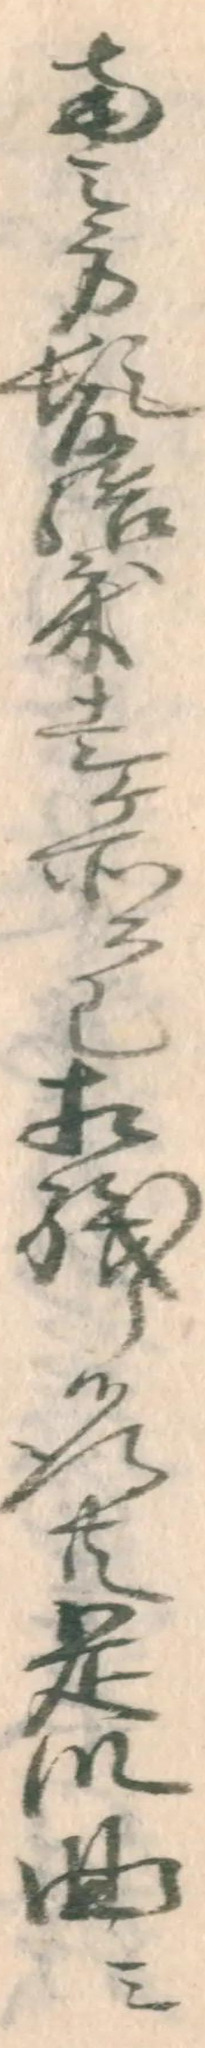南之方髪結床壱ヶ所而已相残リ候得共是以曲ミ
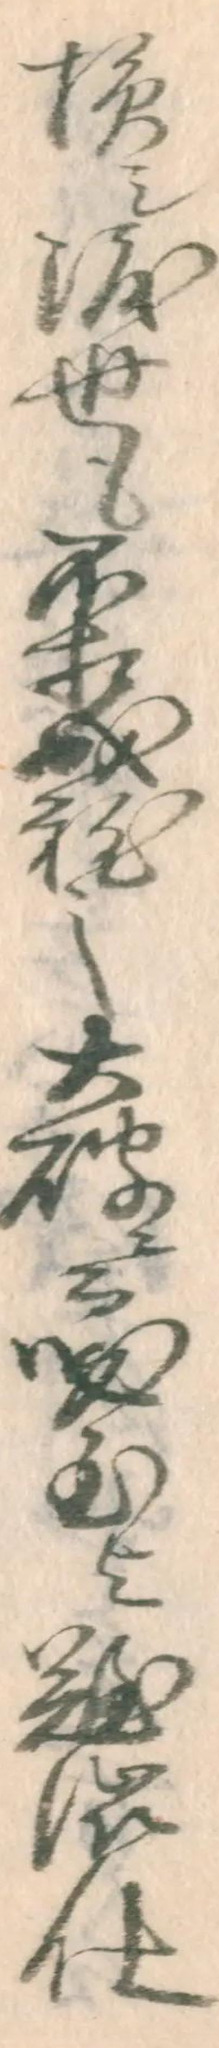損シ渡世も不相成程之大破ニ而必至と難渋仕
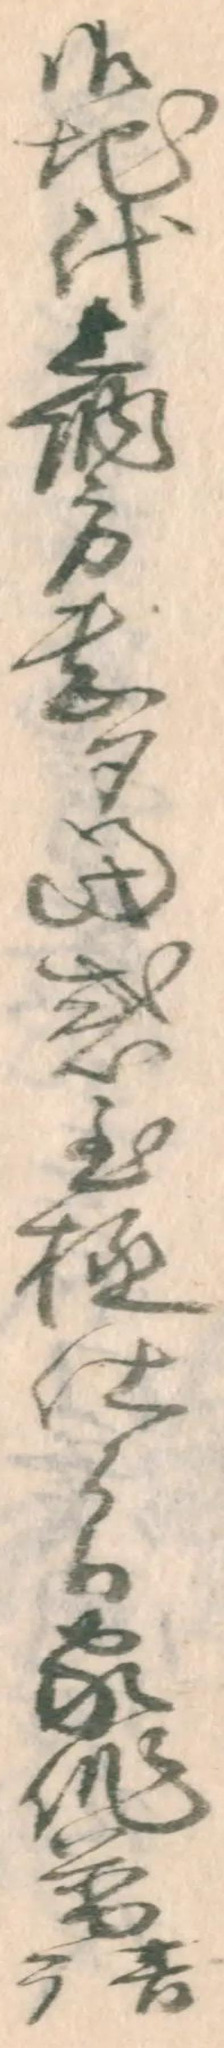御地代上納方甚タ当惑至極仕候間家作普請
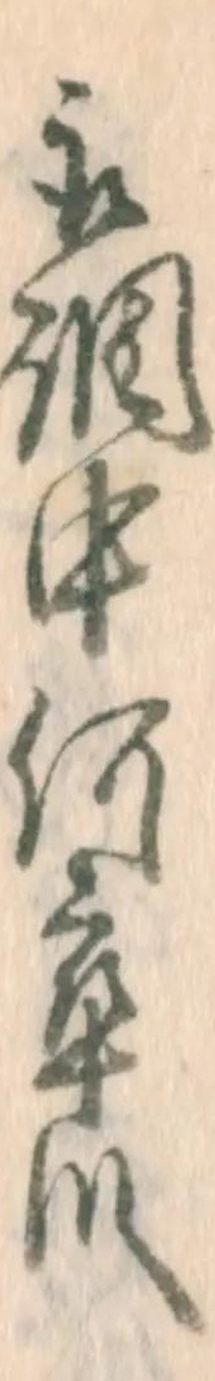取調中何卒以
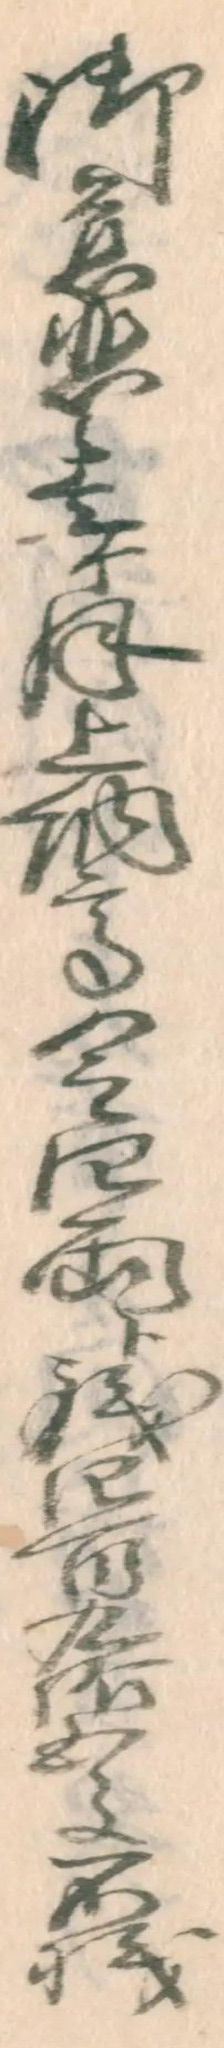御慈悲壱ヶ月上納高金四両ト銭四百九拾五文不残
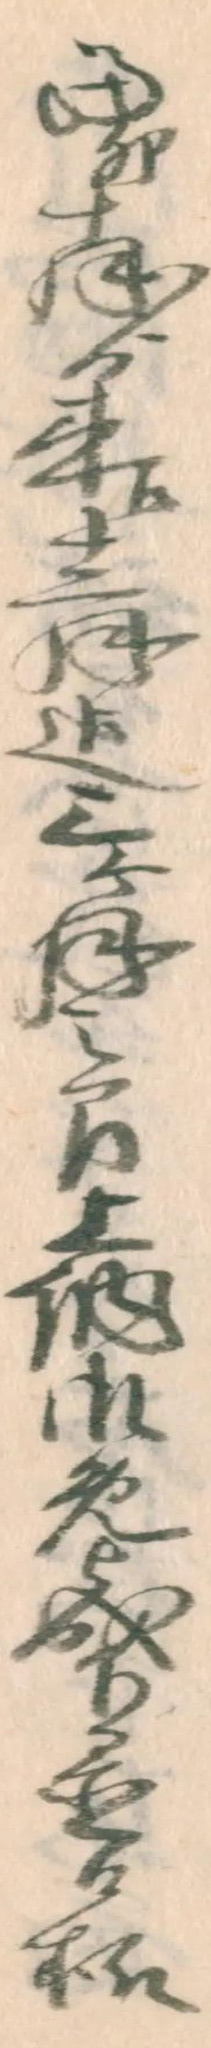当卯十月ゟ来ル十二月迄三ヶ月之間上納御免被成下置候様
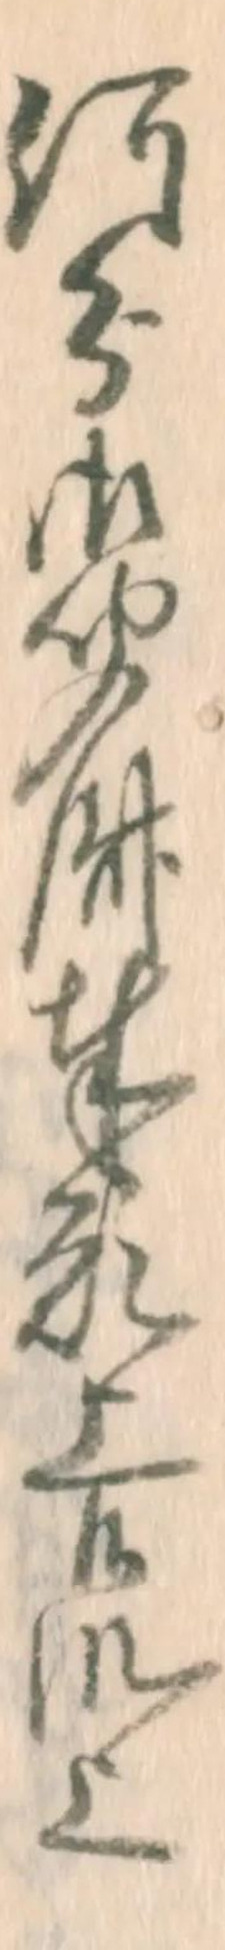何分御聞済奉願上候以上
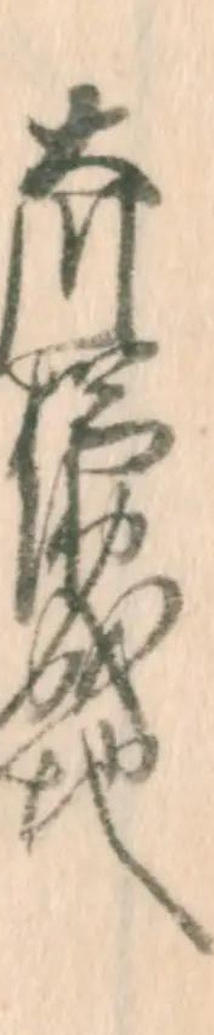大川橋助成地
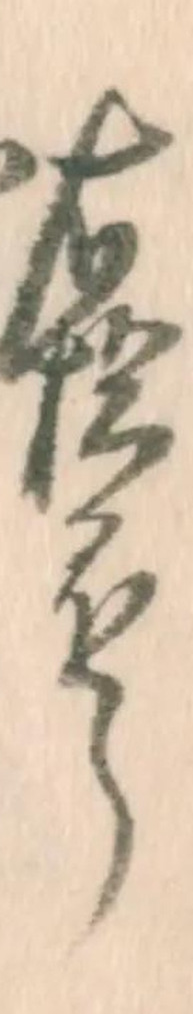右橋懸リ
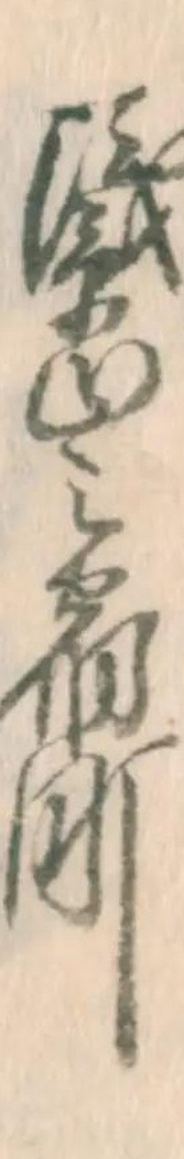浅草山之宿町
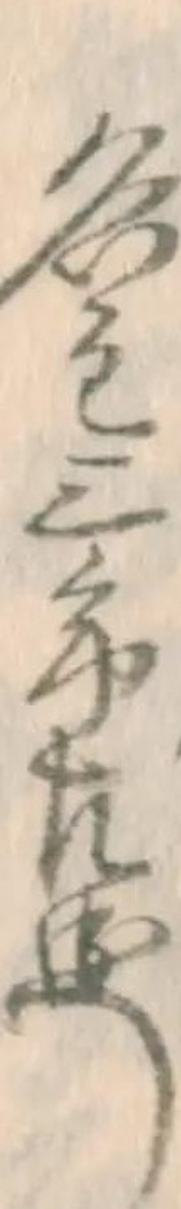名主三郎左衛門
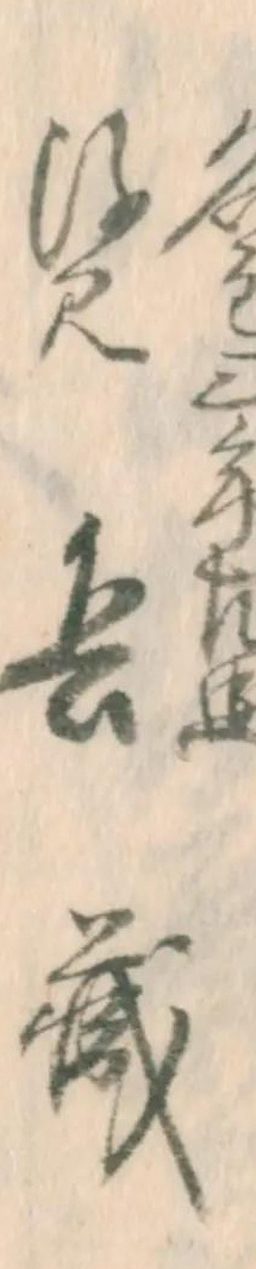後見兵蔵
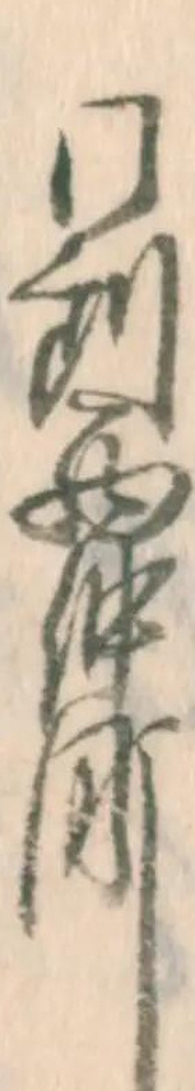同所西仲町
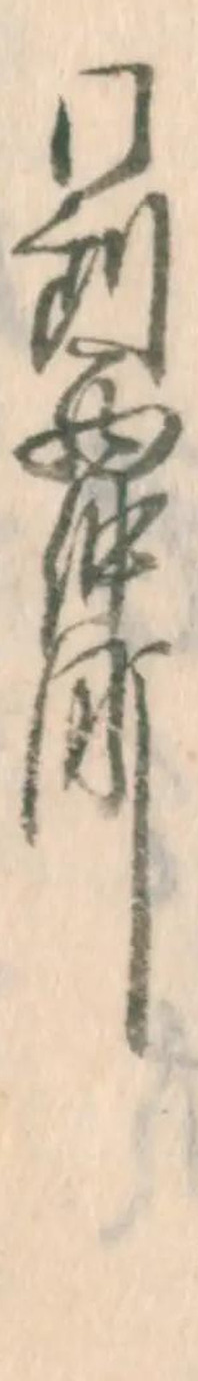同所西仲町
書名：地震災書留 2巻. [1] 内表紙に「地震災書留　安政二卯年　但本所深川御用屋敷地代免除調」とあり
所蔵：国立国会図書館 National Diet Library, JAPAN
